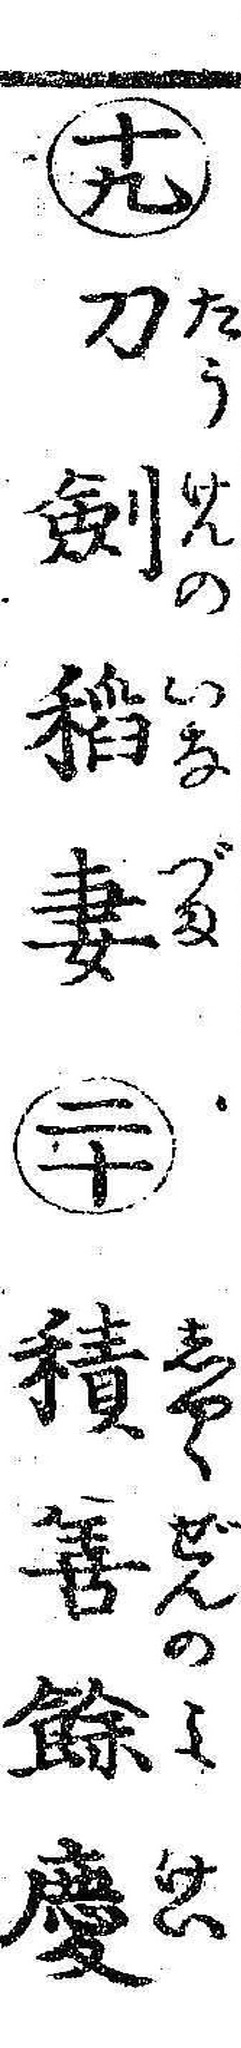十九刀剣稲妻二十積善余慶
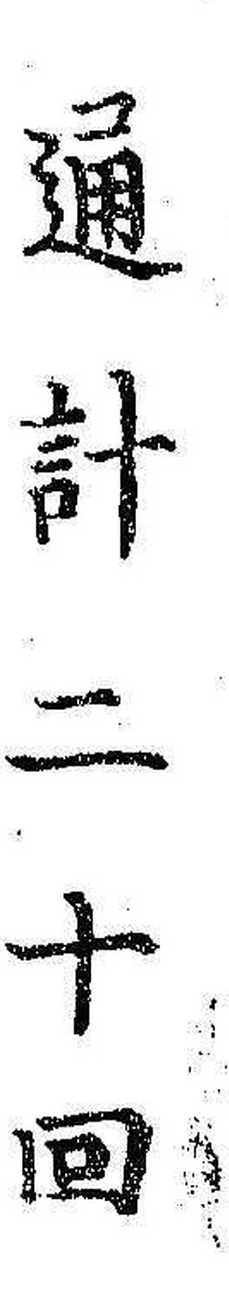通計二十回
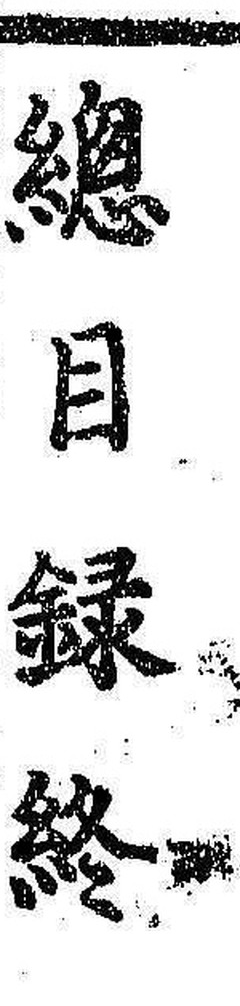総目録終
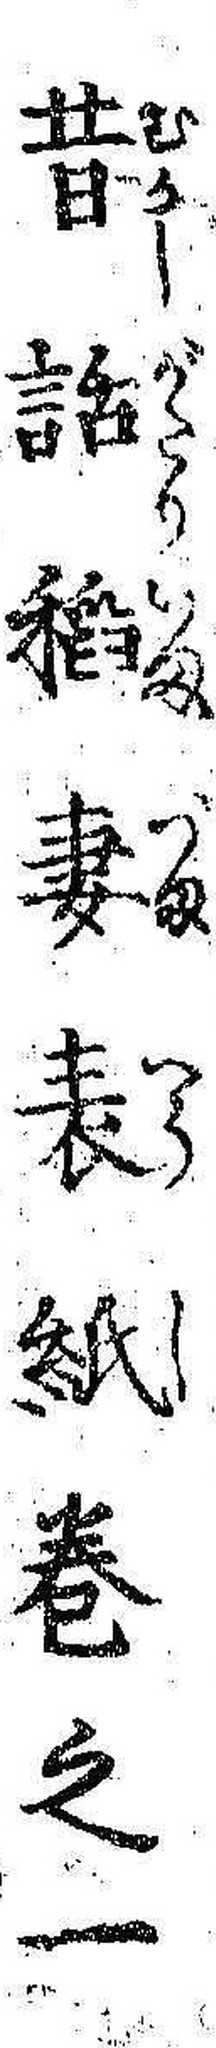昔話稲妻表紙巻之一
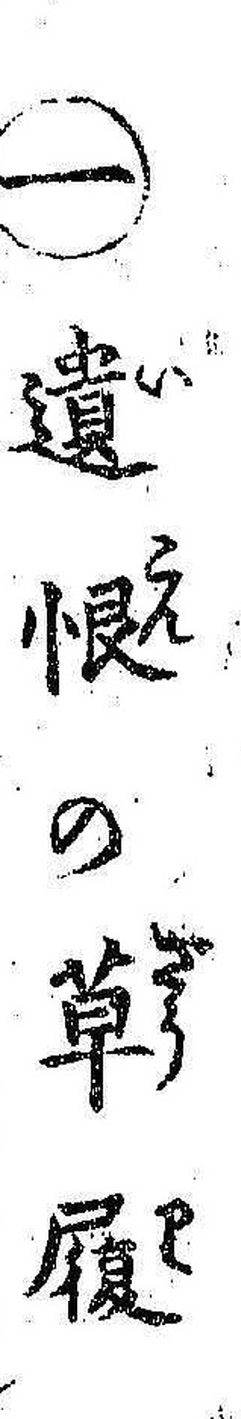一遺恨の草履
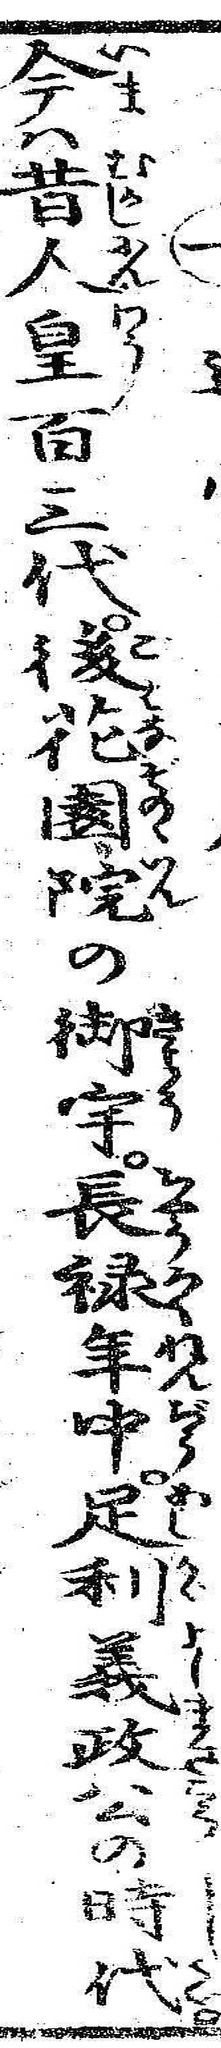今は昔人皇百三代。後花園院の御宇。長禄年中。足利義政公の時代。
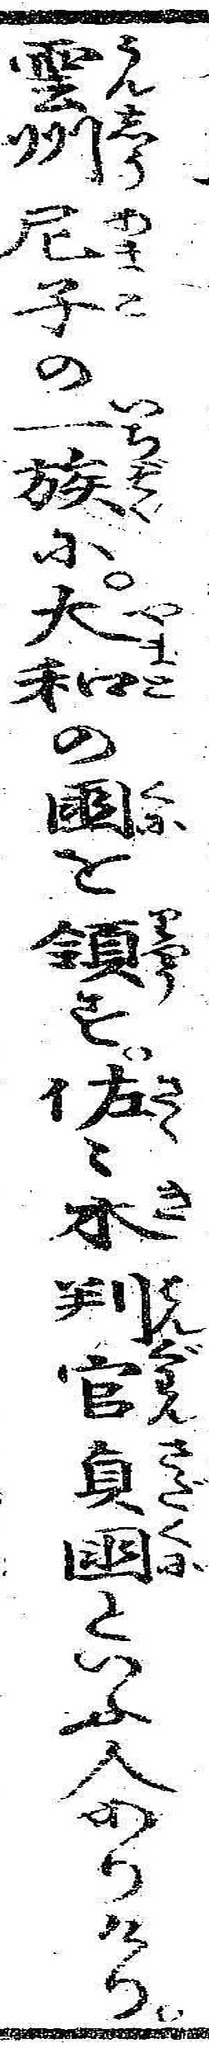雲州尼子の一族に。大和の国を領す。佐々木判官貞国といふ人ありけり。
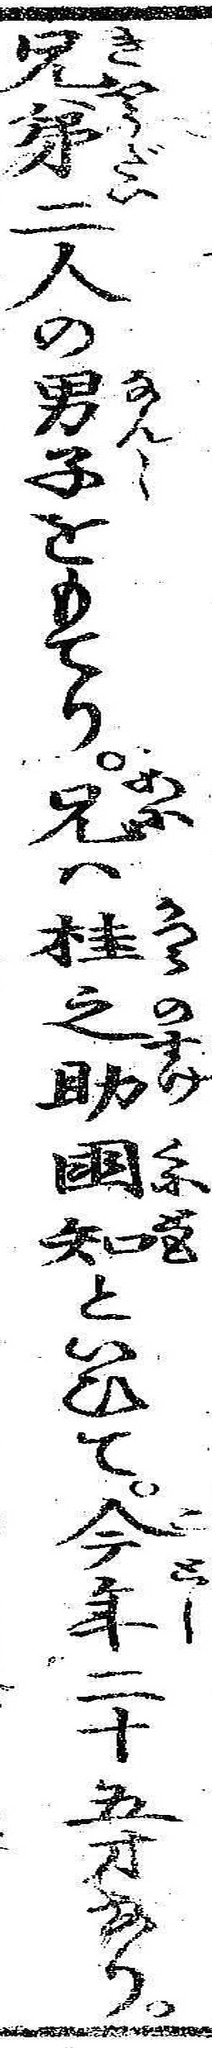兄弟二人の男子をもてり。兄は桂之助国知といひて。今年二十五才なり。
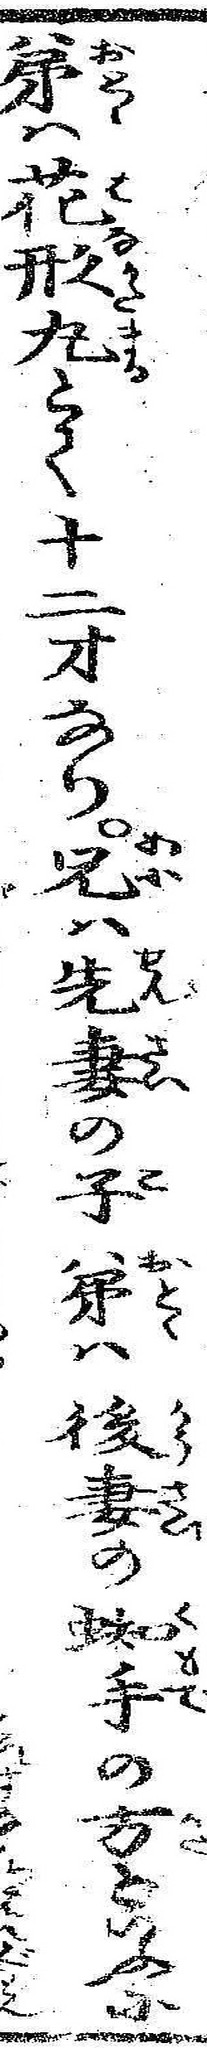弟は花形丸とて十二才なり。兄は先妻の子弟は後妻の蜘手の方といふに
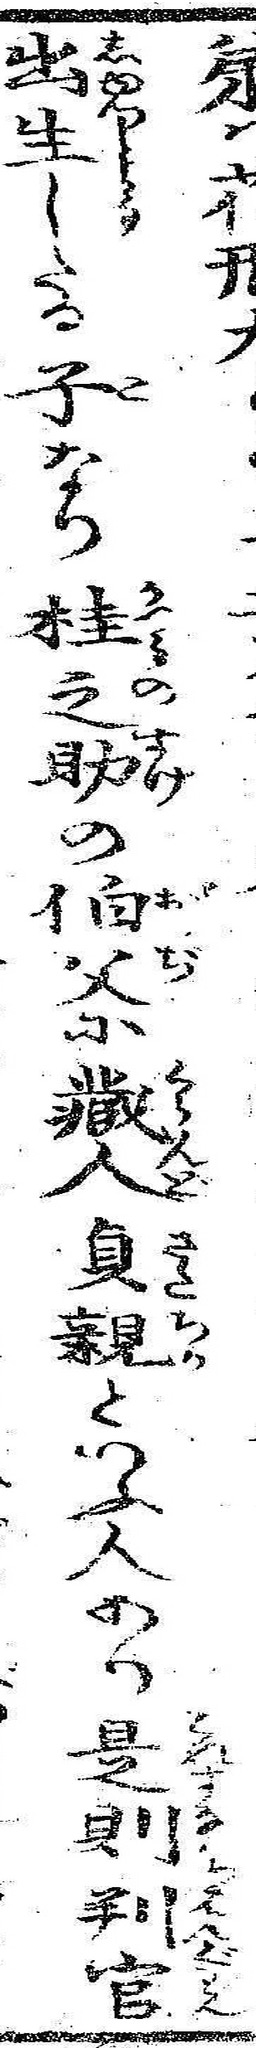出生したる子なり桂之助の伯父に蔵人貞親といふ人あり是則判官
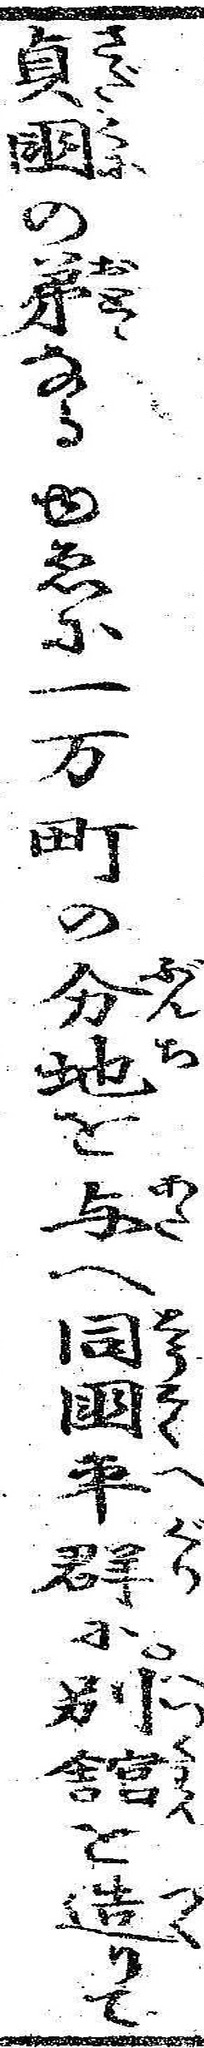貞国の弟なるゆゑに一万町の分地を与へ同国平群に。別館を造りて
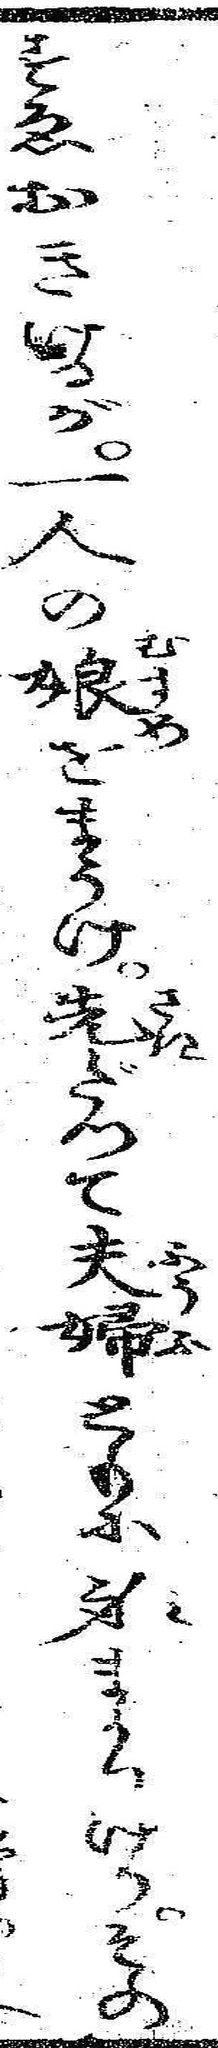すゑおきけるが。一人の娘をまうけ。先だつて夫婦ともに身まかりけり。その
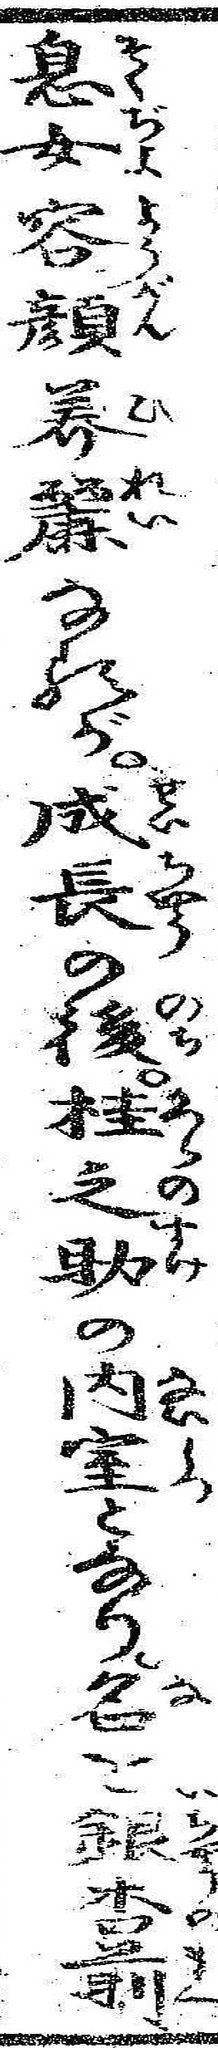息女容顔美麗なるが。成長の後。桂之助の内室となり。名を銀杏前

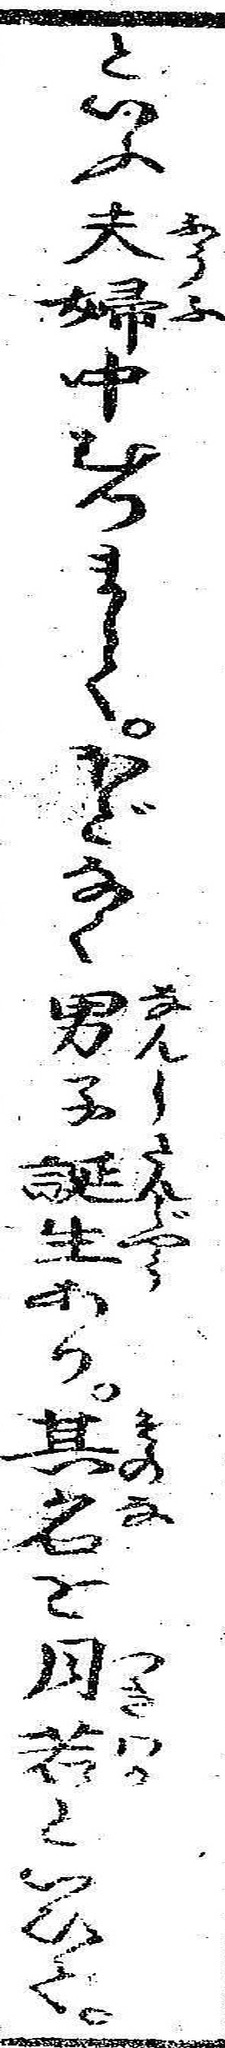といふ夫婦中むつましく。ほどなく男子誕生あり。其名を月若といひて。
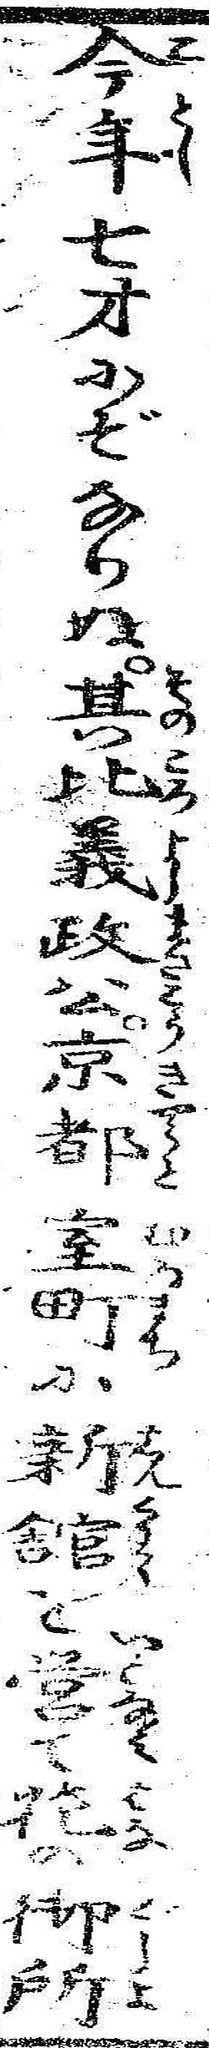今年七才にぞなりぬ。其比義政公。京都室町に新館を営て花の御所
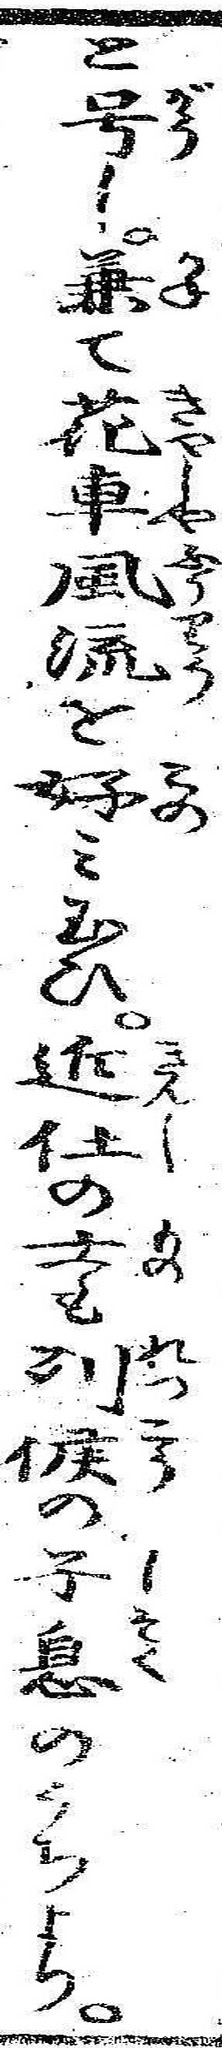と号し。兼て花車風流を好み玉ひ。近仕の士も列侯の子息のうちより。
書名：昔話稲妻表紙
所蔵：国文学研究資料館
